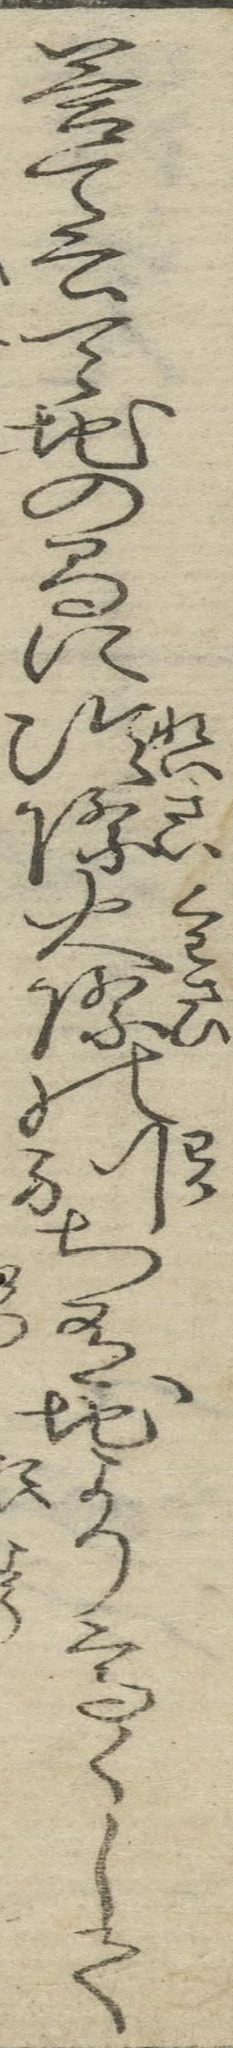答て云天地の間に冷際火際の別ち有地より高くして
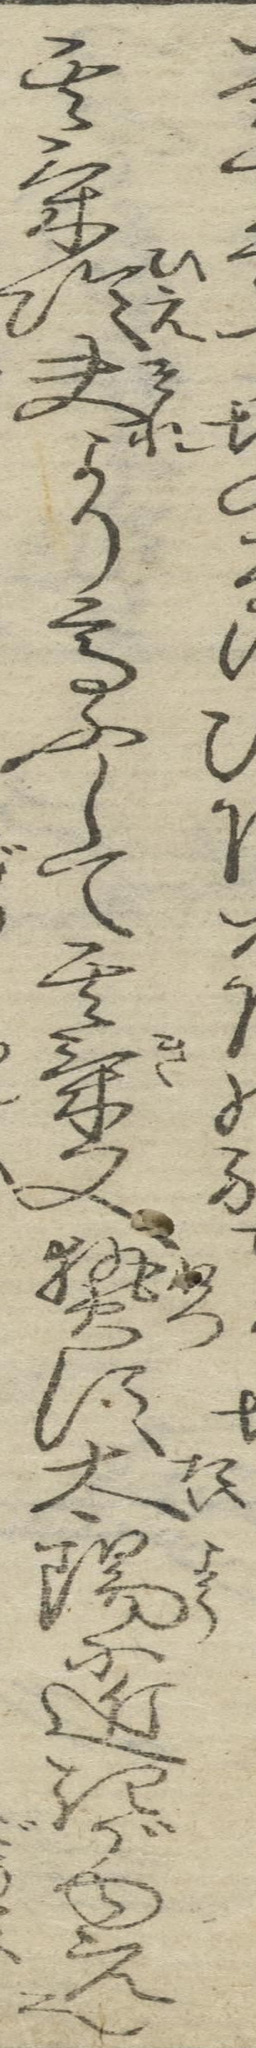其気冷夫より高ふして其気又熱す太陽に近きがゆえ也
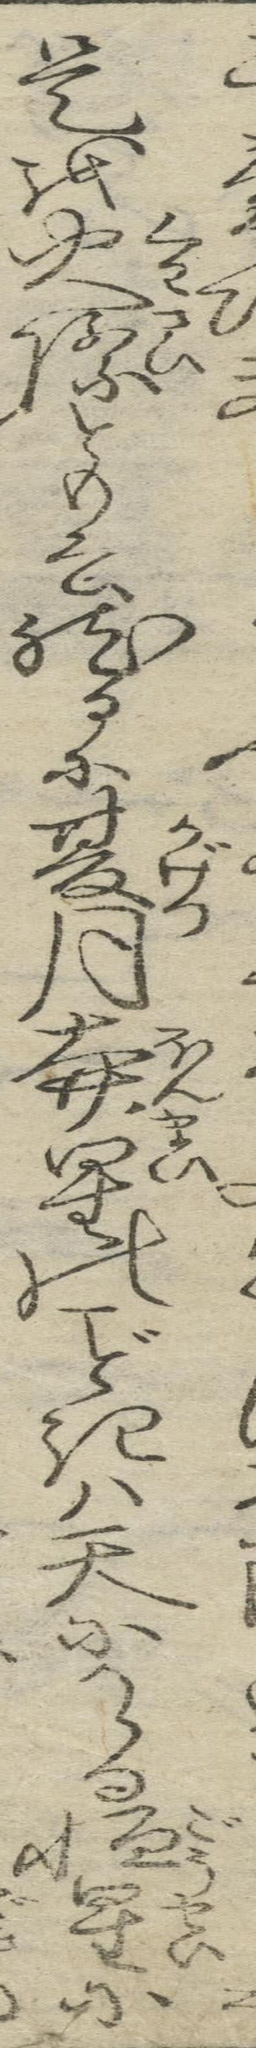是を火際とも云然るに夏月奔星のごときは天にかゝる恒星に
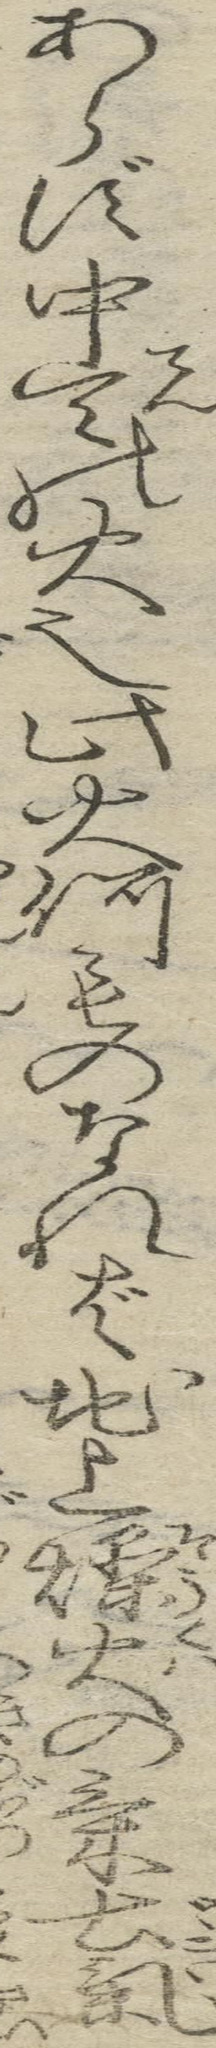あらず中天の火也此火何ものなれば地上標ほう火の気土気
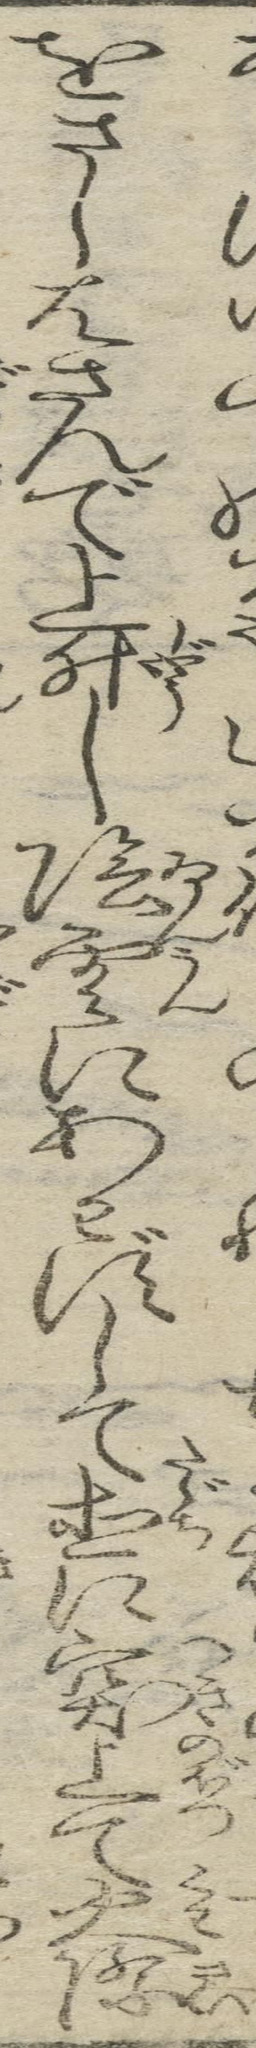をさしはさんで上升し陰雲にあわずして直に究上て火際
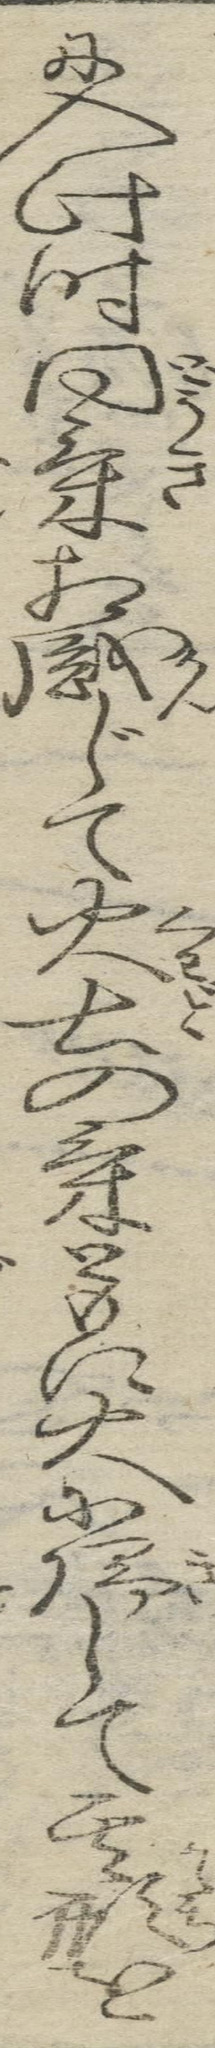に入此時同気相感じて火土の気ともに大に帰して其形を
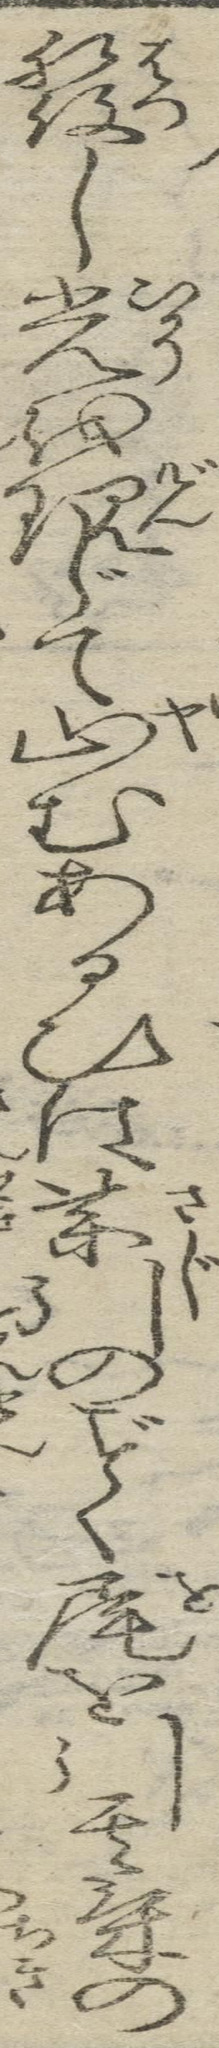発し光を現じて止むあるひは茶引のごとく尾を引其気の
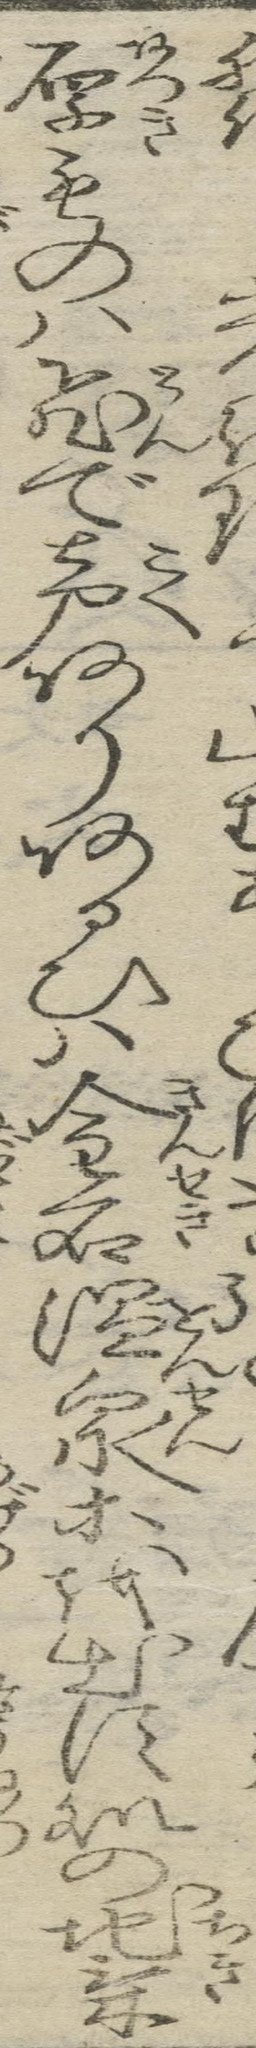厚ものは飛で声ありあるひは金石温泉等を出す処の土気
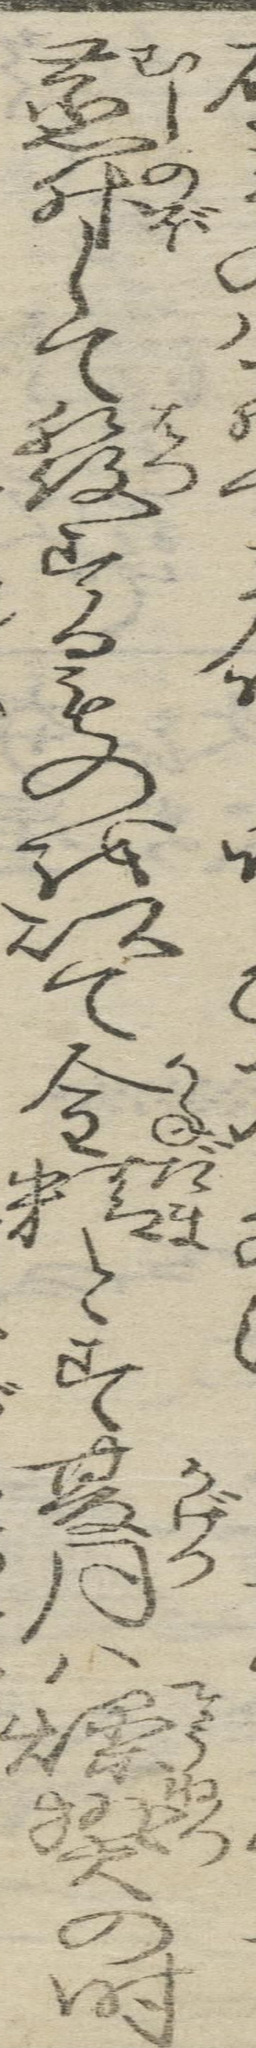蒸升して発するものを以て金精とす夏月は燥熱の時
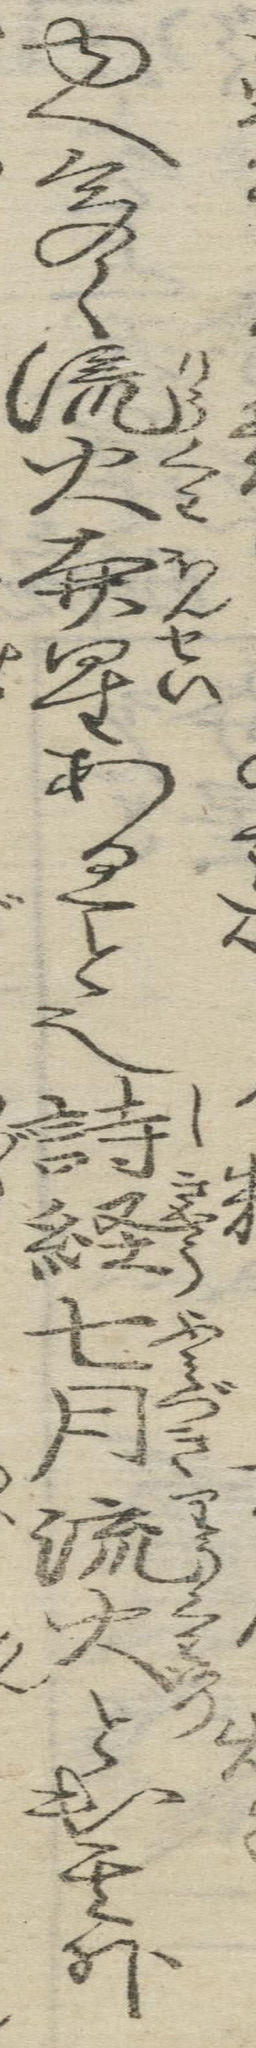ゆへ多く流火奔星あること也詩経七月流火と其外
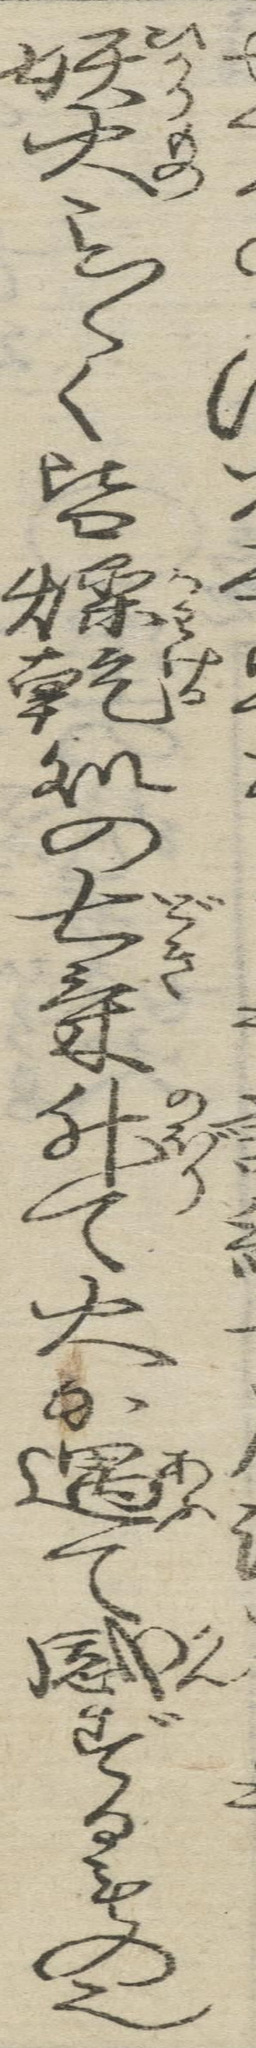妖火こと〳〵く皆燥乾処の土気升て火に遇て感ずるもの也
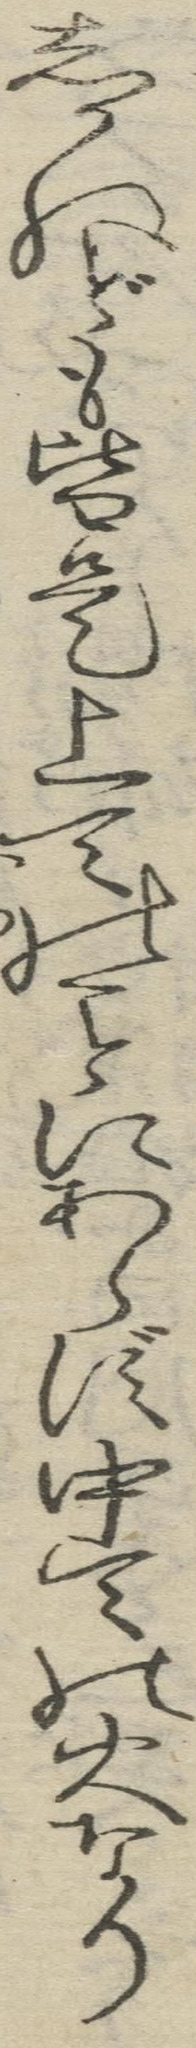しかれども皆是上天のことにあらず中天の火なり
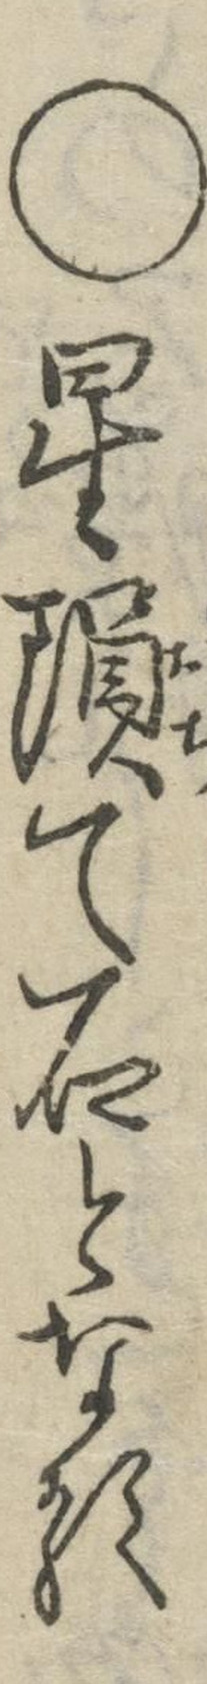○星隕て石となる
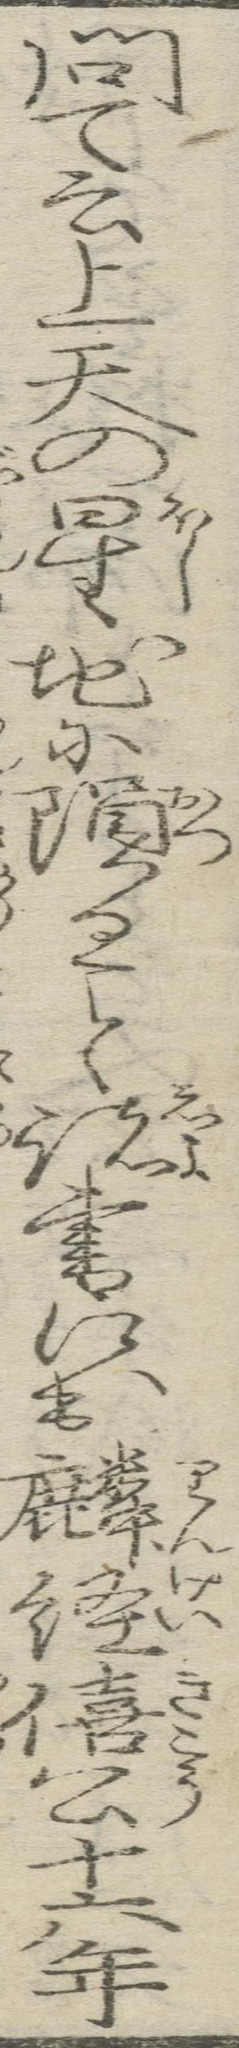問て云上天の星地に隕ること諸書に出麟経僖公十六年
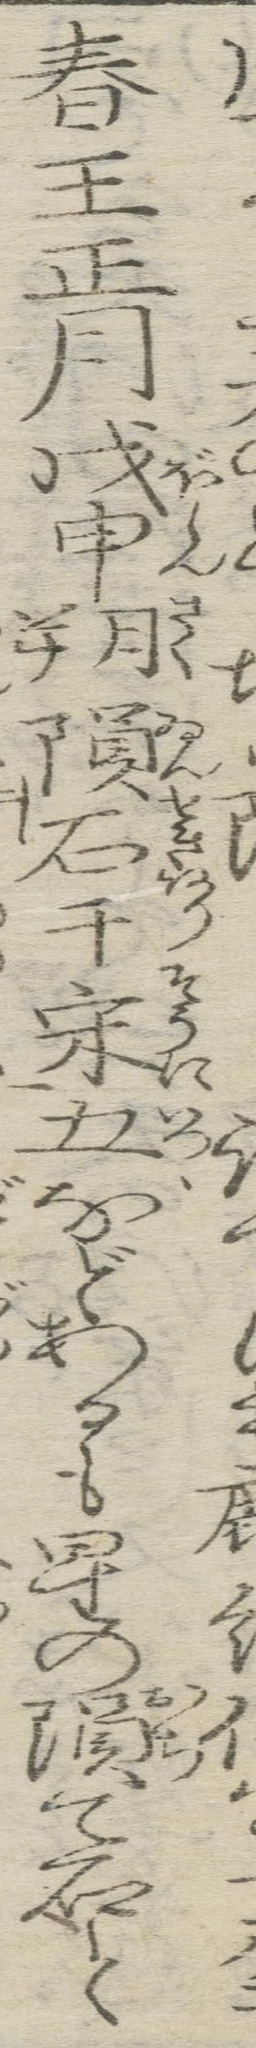春王正月戊申朔隕石于宋五などあるも星の隕て石と
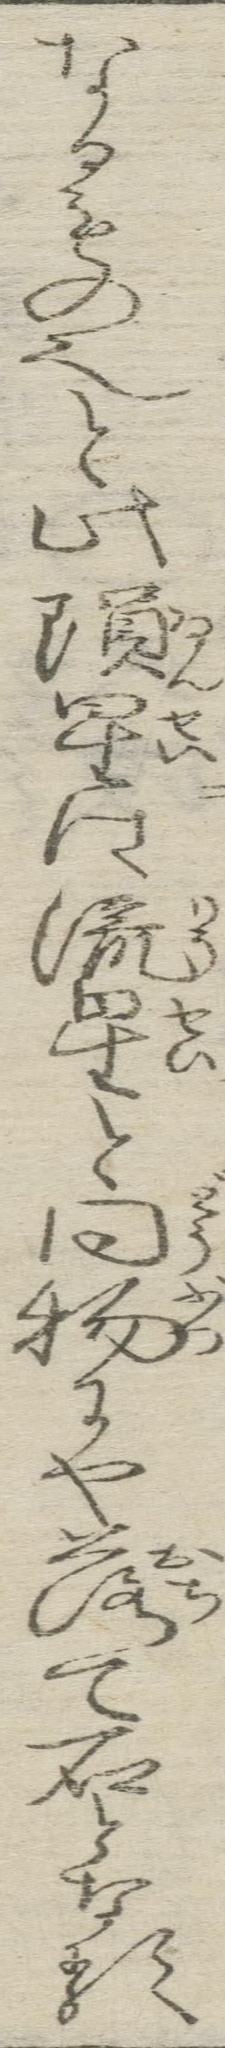なるもの也と此隕星は流星と同物にや落て石となる
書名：訓蒙天地辨　天
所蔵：東京大学地震研究所図書室 Earthquake Research Institute Library, The University of Tokyo, JAPAN
